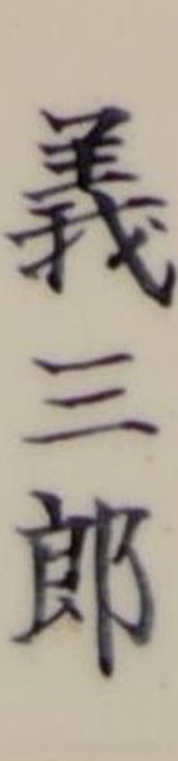義三郎
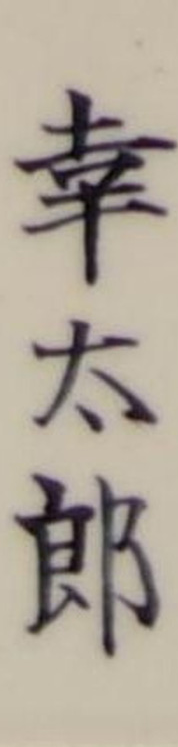幸太郎

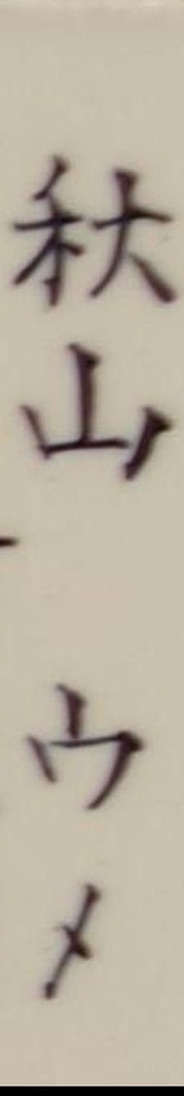秋山ウメ
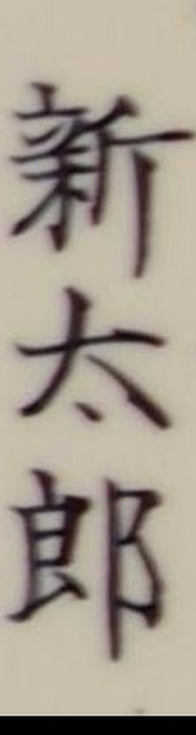新太郎
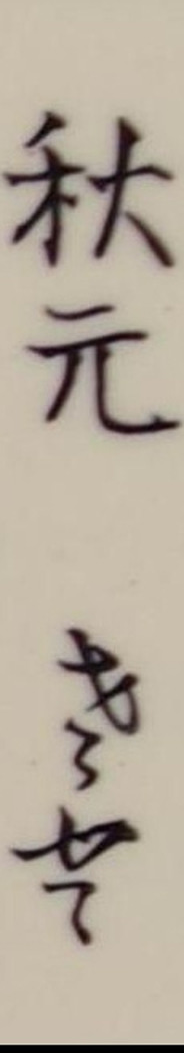秋元さと
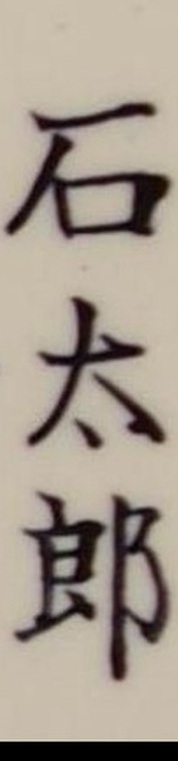石太郎
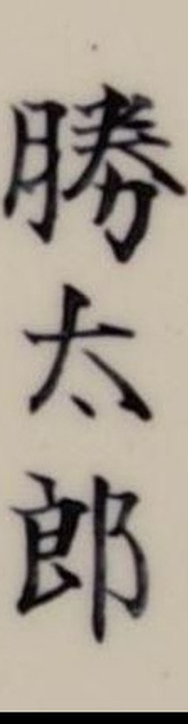勝太郎
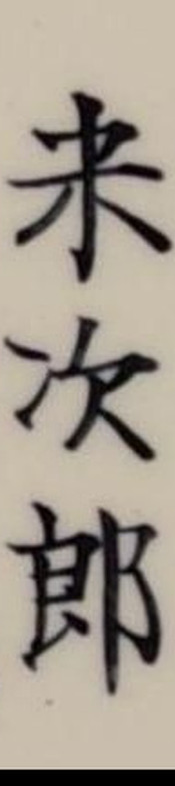米次郎
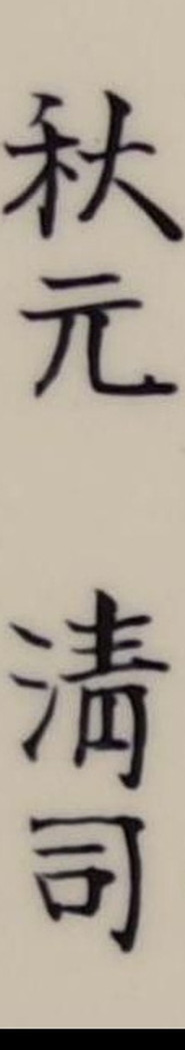秋元清司
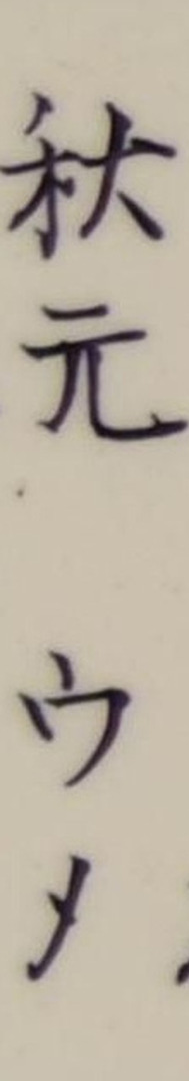秋元ウメ
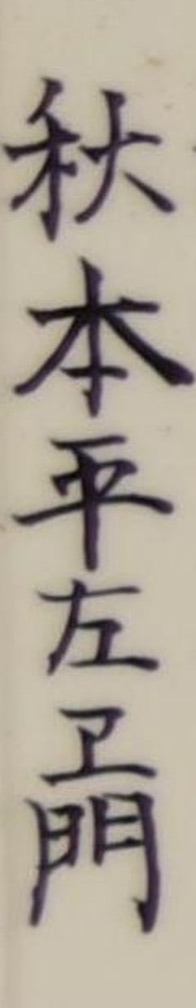秋本平左ヱ門

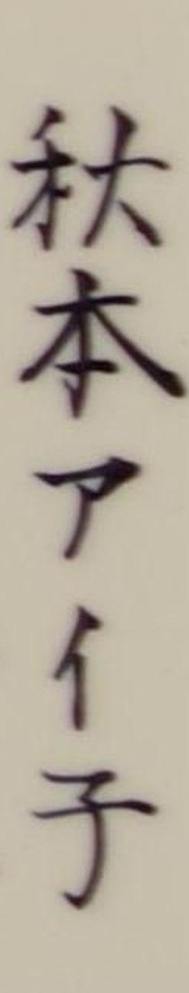秋本アイ子
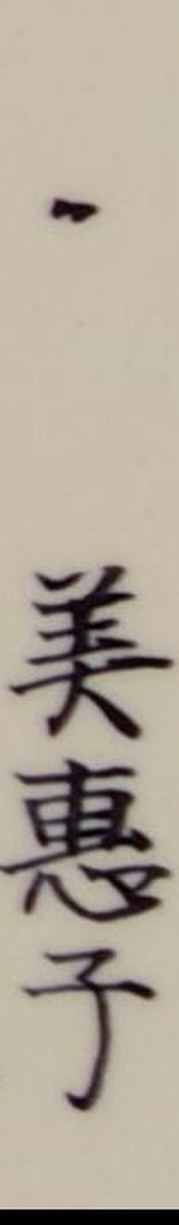美恵子
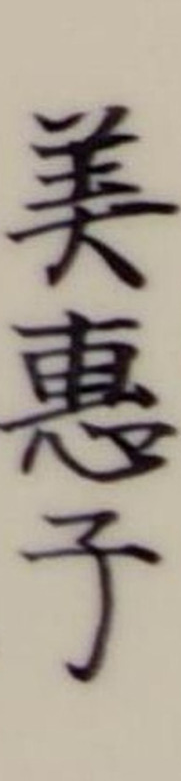美恵子
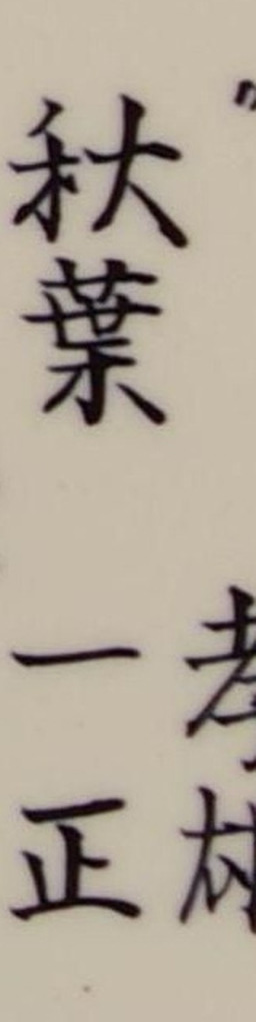秋葉一正
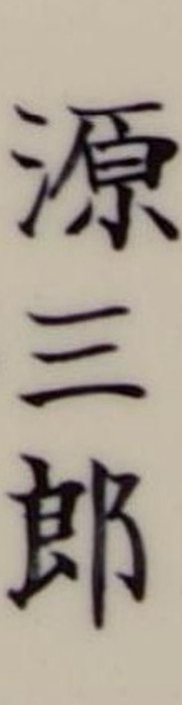源三郎
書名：E~L
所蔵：高野山金剛峯寺
